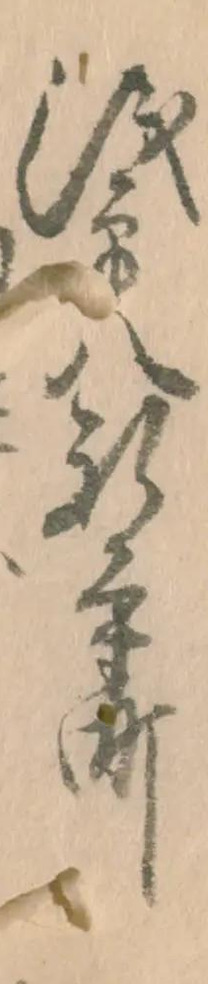浅草八軒寺町
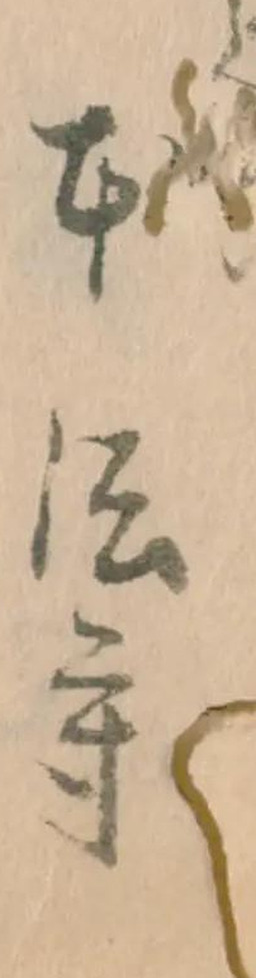本法寺
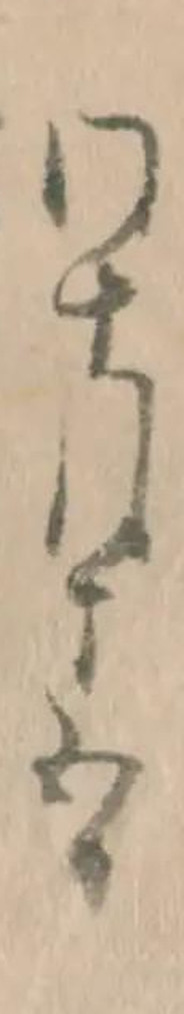同十月十五日

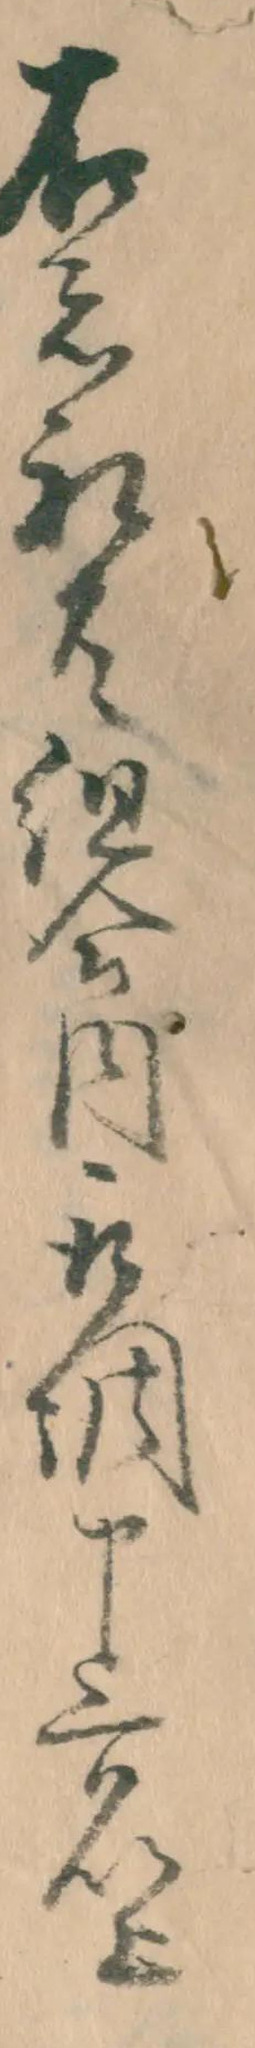右は私共組合内取調申上候以上
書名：武家方并寺院等ニテ施差出候一件
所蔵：国立国会図書館 National Diet Library, JAPAN
